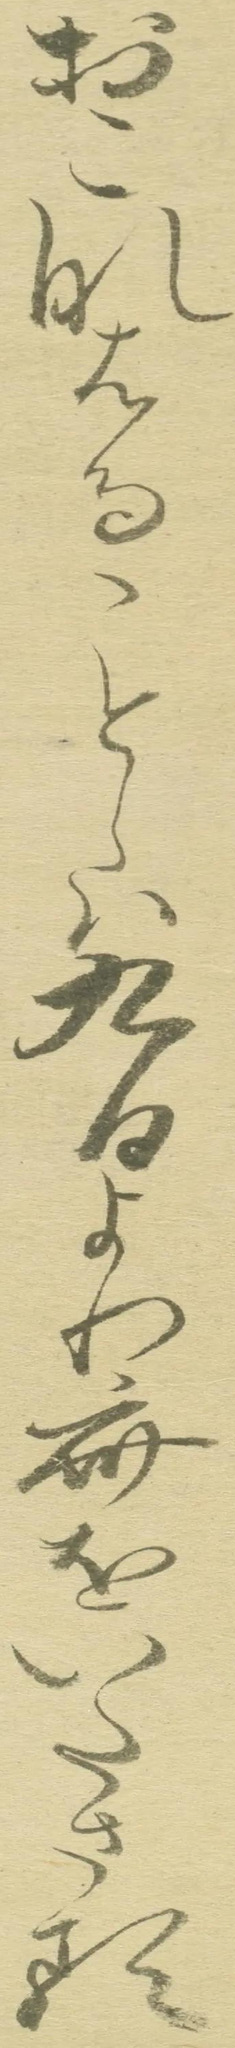おこなはるゝとしは九日より斎をいたさる
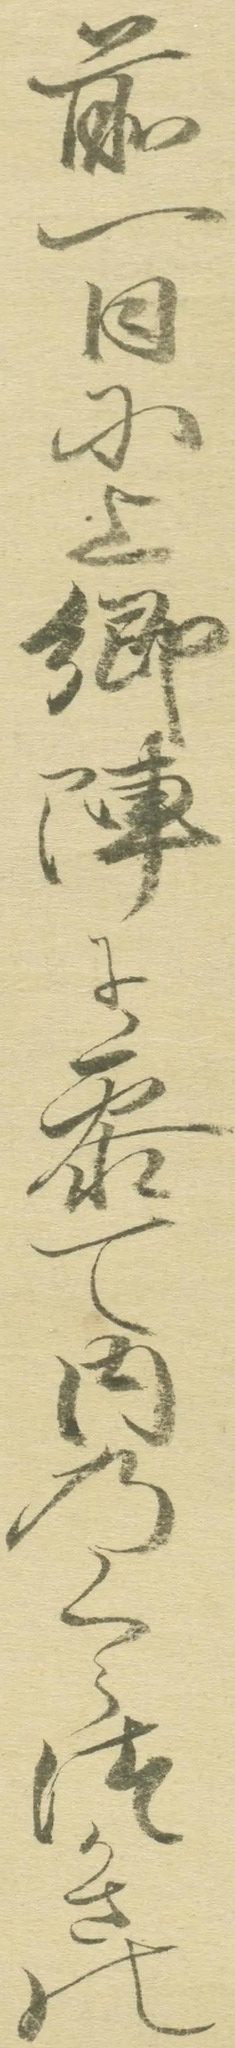前一日に上卿陣に参て内のくらつかさの
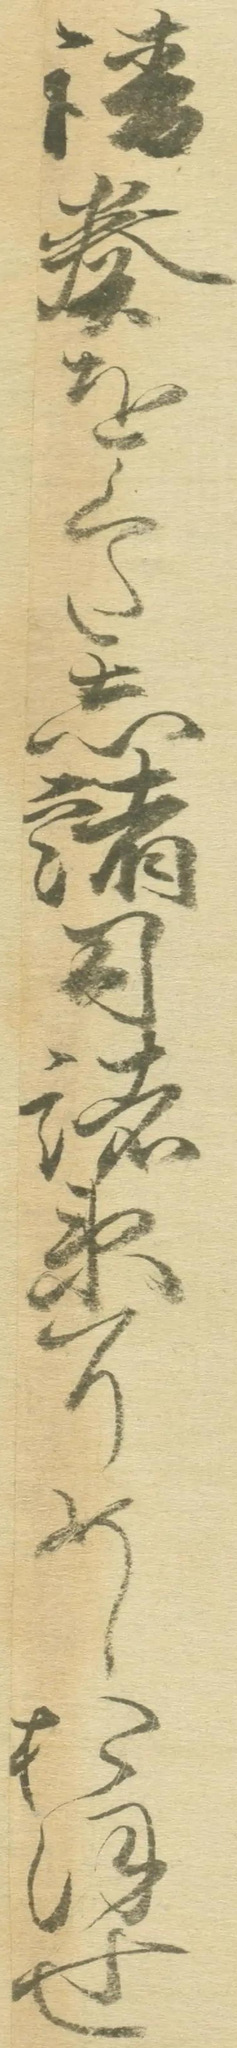請奏をくたし諸司諸衛にめしおほせ
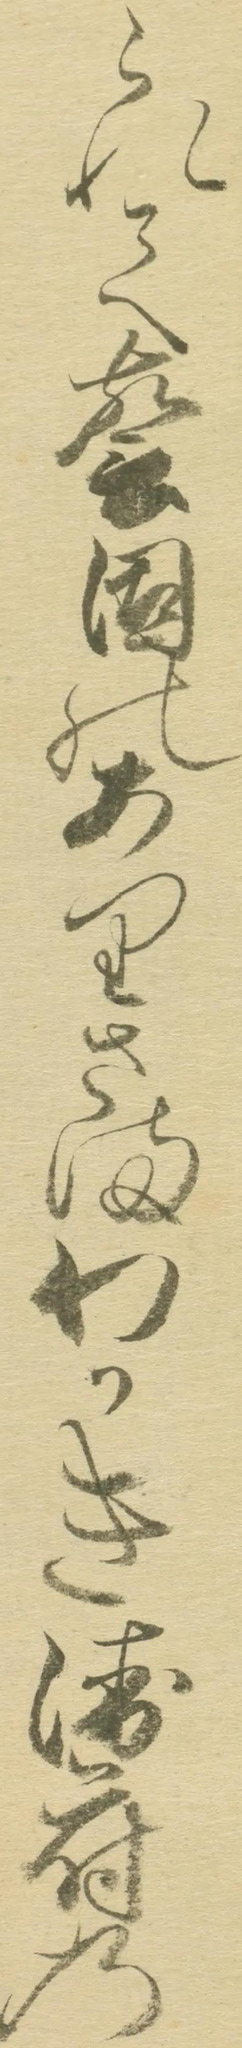られて警固のありさまわかき衛府の
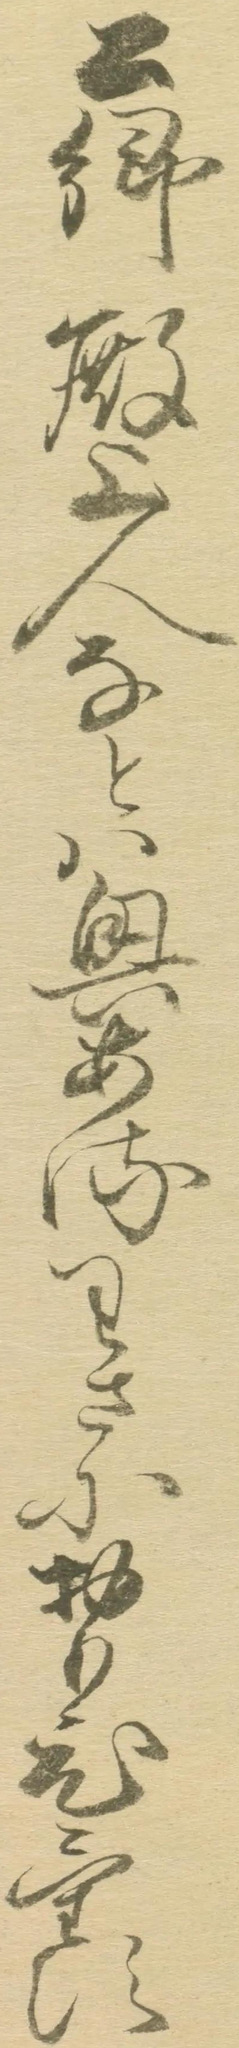公卿殿上人なとは興あるわさにおもひけす
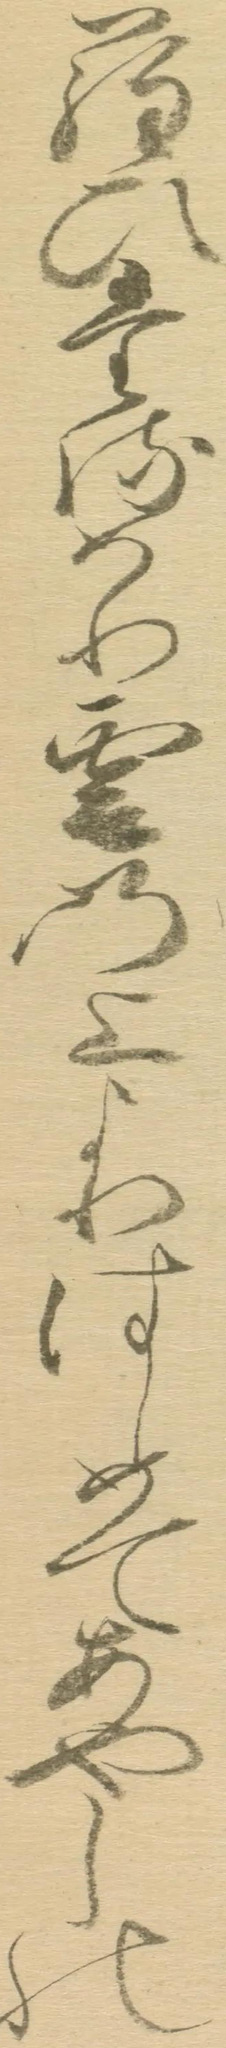らひたるめり雲の上よりはしめてあやしの
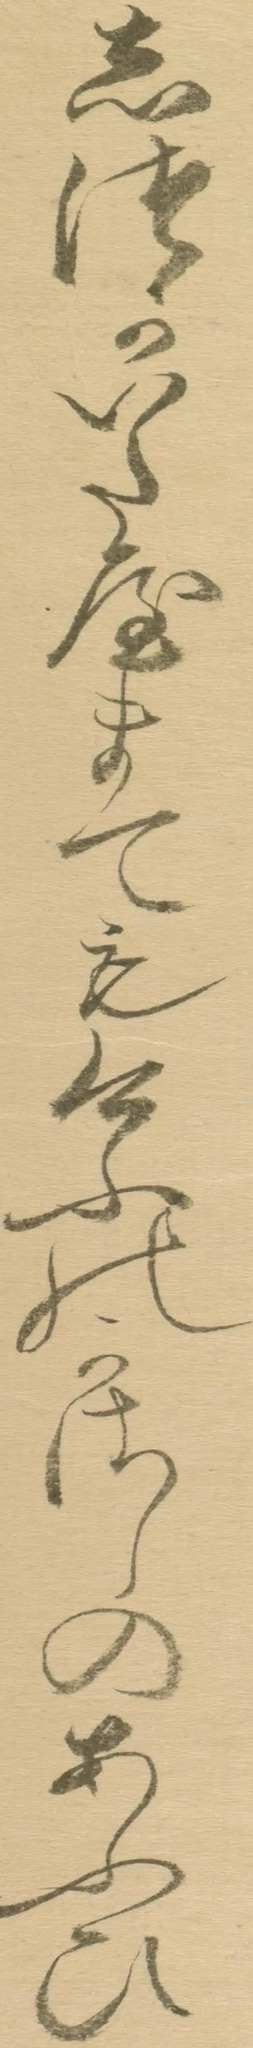しつかいたやまてもけふのかさしのあふひ

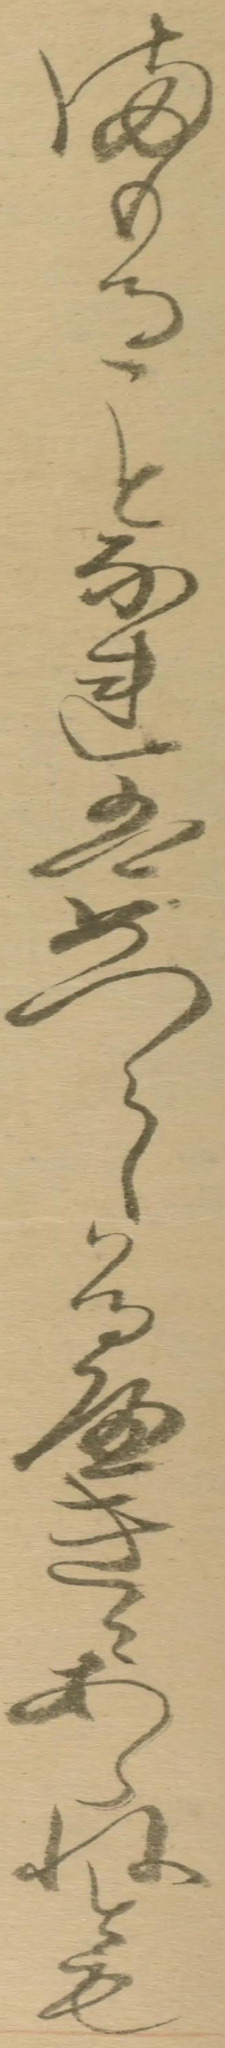まもることなれはめつらしかるへきにあらねとも
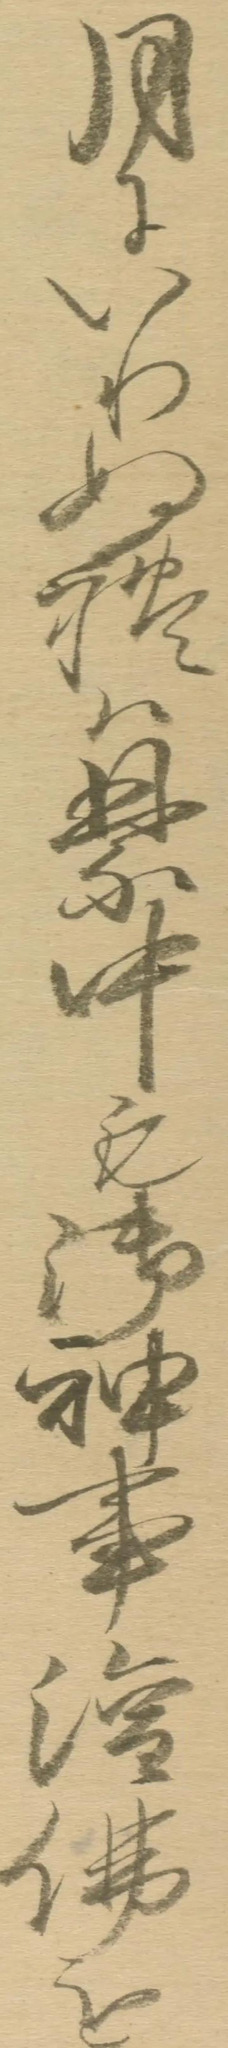月にいりぬれは禁中も御神事潅仏を
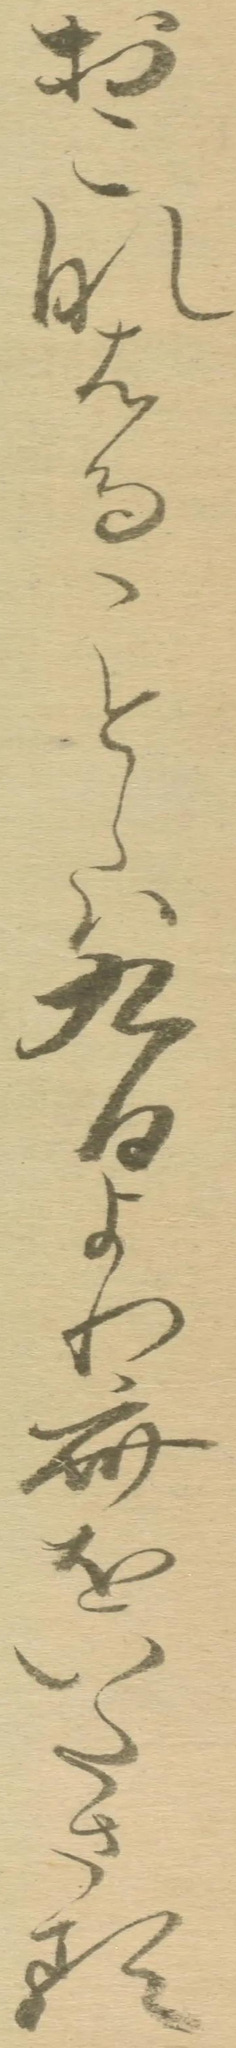おこなはるゝとしは九日より斎をいたさる
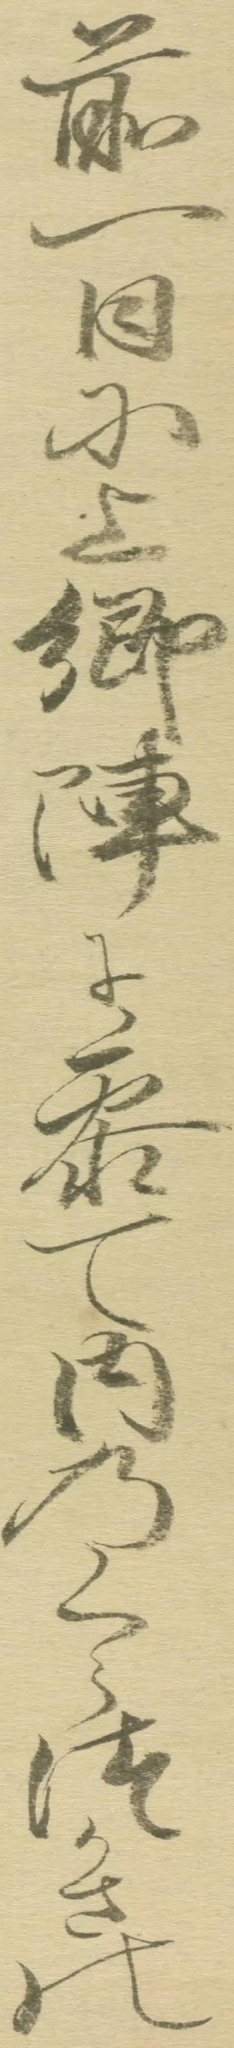前一日に上卿陣に参て内のくらつかさの
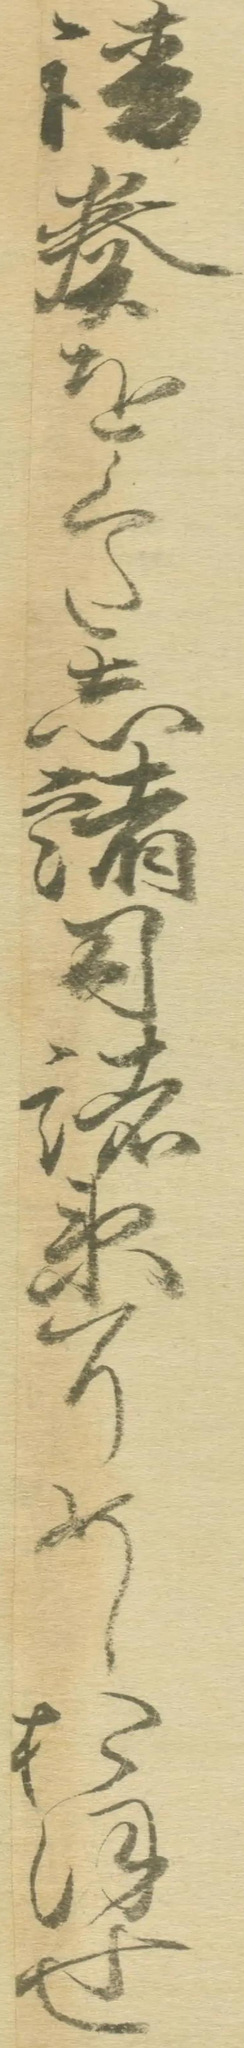請奏をくたし諸司諸衛にめしおほせ
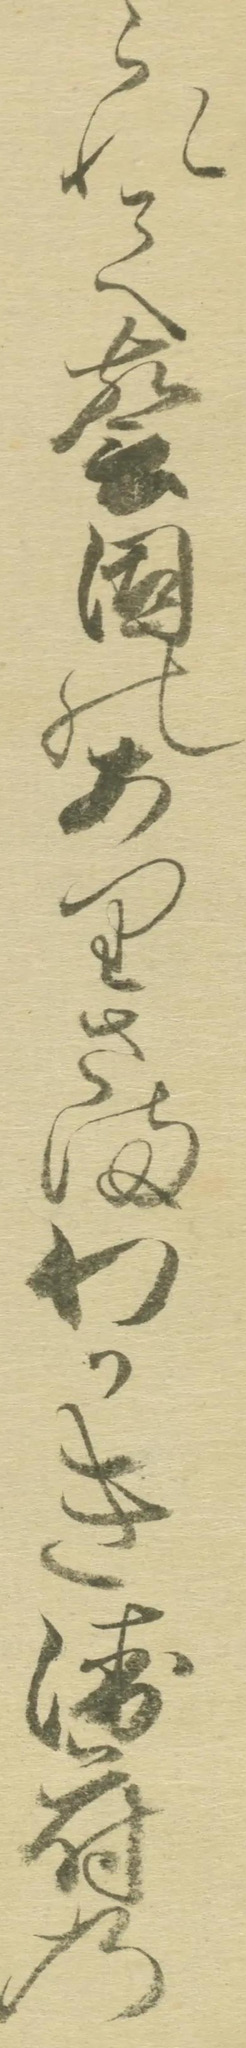られて警固のありさまわかき衛府の
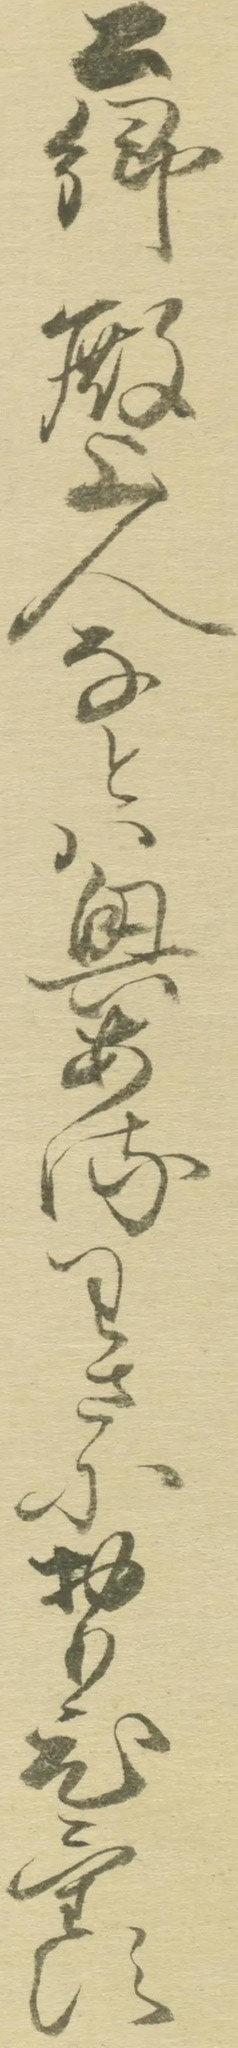公卿殿上人なとは興あるわさにおもひけす
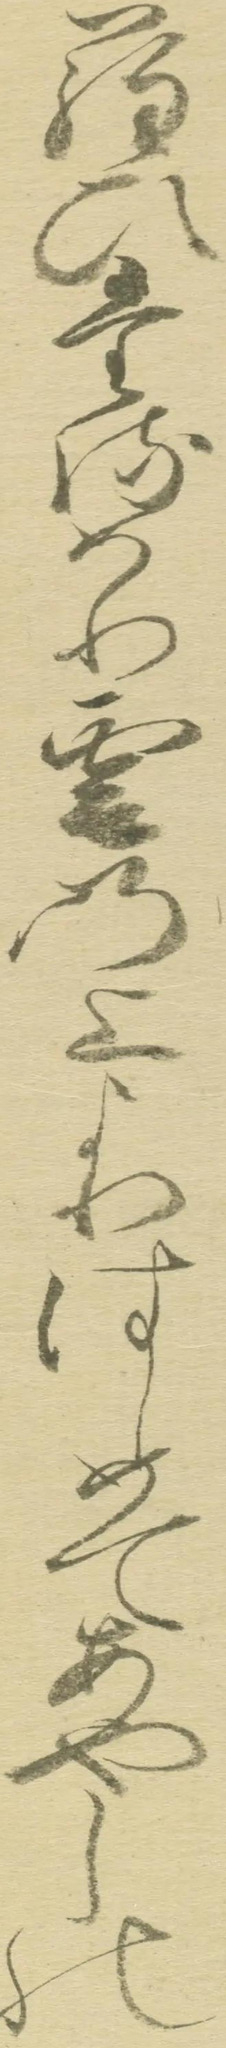らひたるめり雲の上よりはしめてあやしの
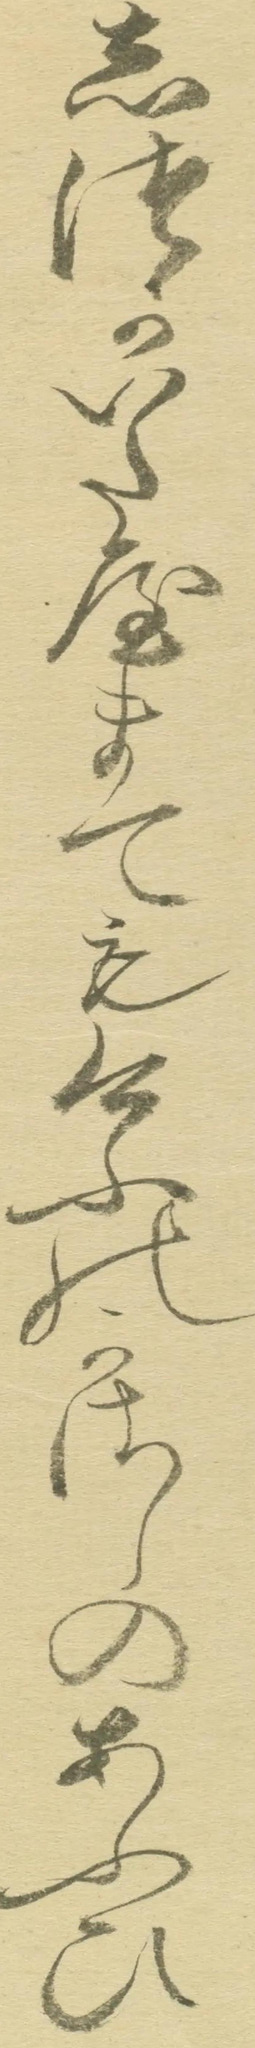しつかいたやまてもけふのかさしのあふひ
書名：賀茂祭縁起
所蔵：国立国会図書館 National Diet Library, JAPAN
